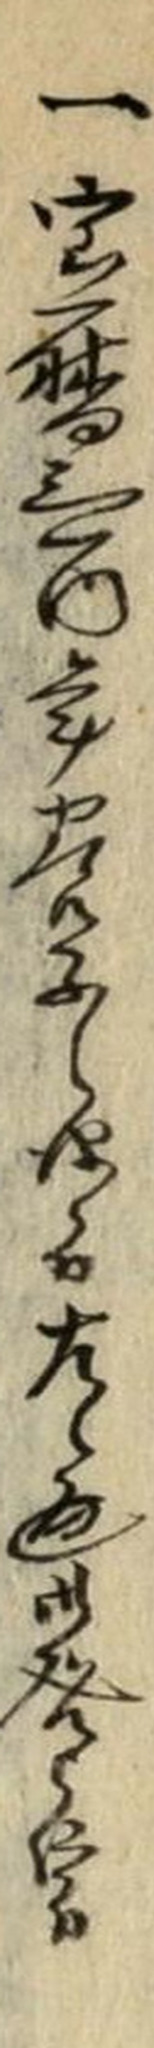一宝暦三酉年養子之儀に付左之通御咎被仰付
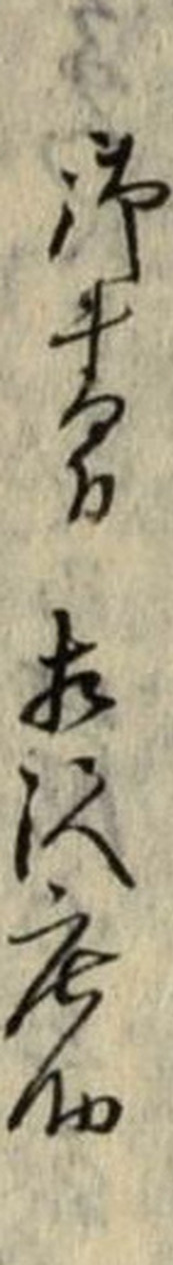御書付相沢庄助
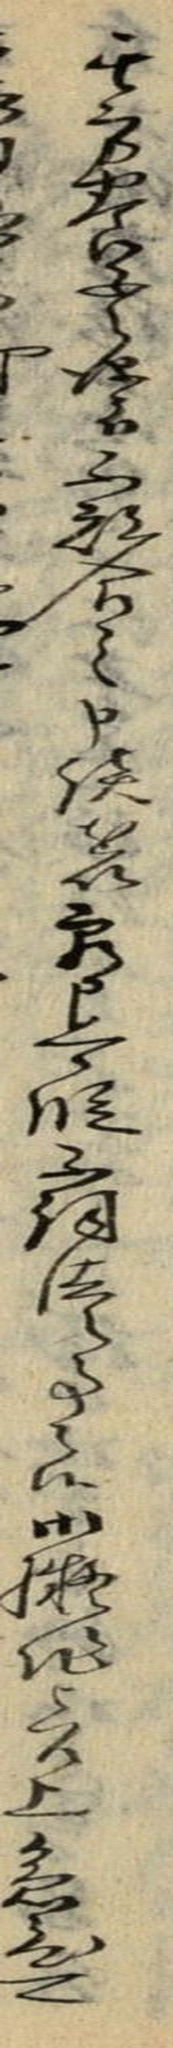其方養子之儀に付不都合之申談を以願申上候段不調法之事に候御擬作被召上急度可
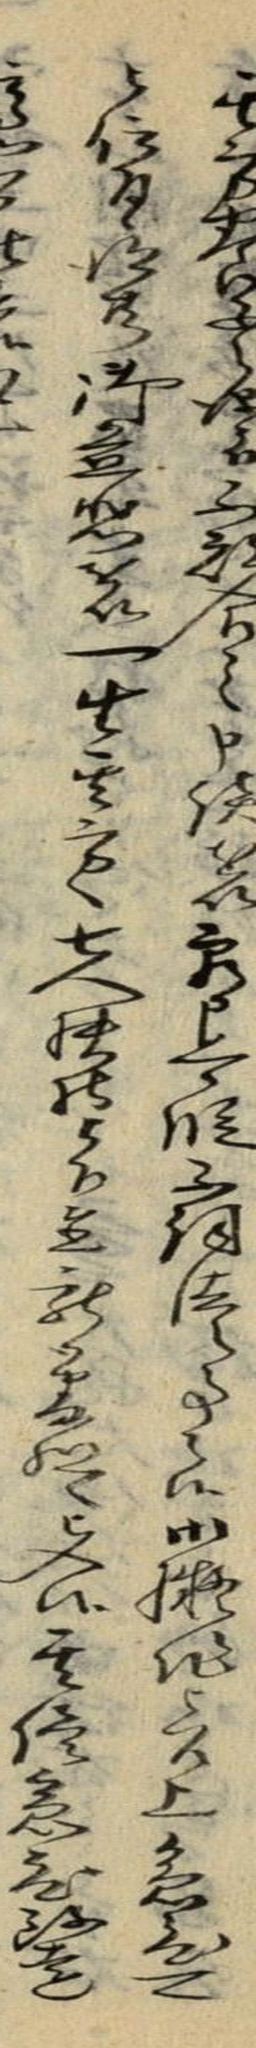被仰付候得共御慈悲を以一生其方へ七人扶持被下置新御番組へ被入候其侭急度致遠
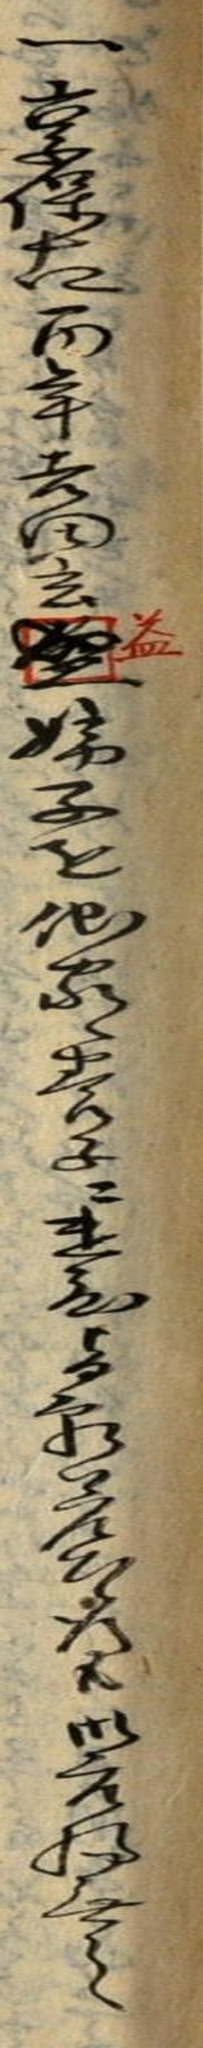一享保十四酉年吉田玄盛嫡子を他家へ養子に遣度旨願差出候得共御取揚無之
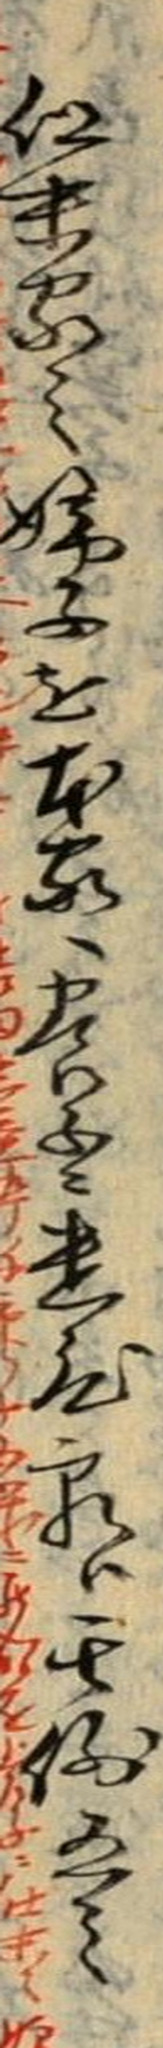但末家之嫡子を本家へ養子に遣度願は其例有之
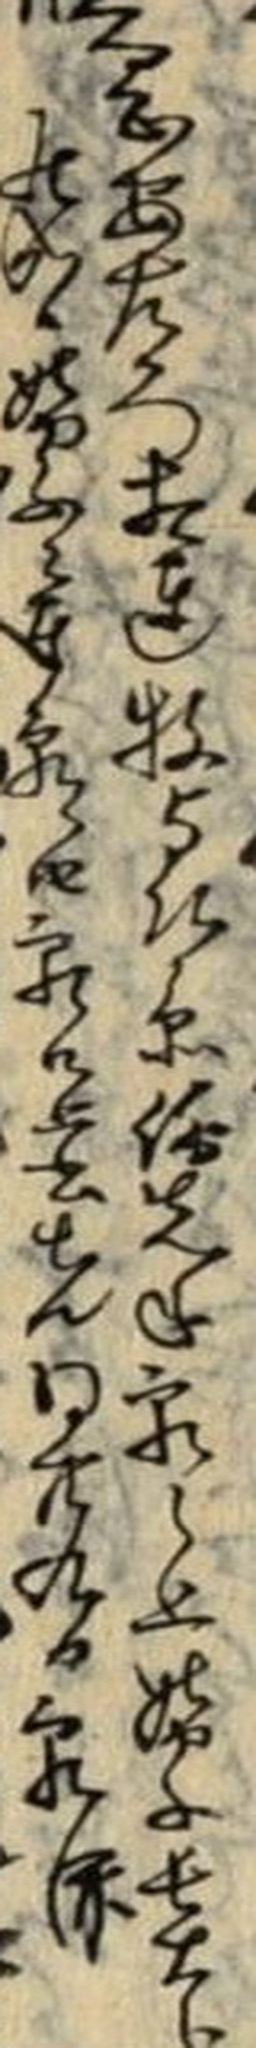罷成候嫡子に奉願候由願口上書出る同廿九日願済
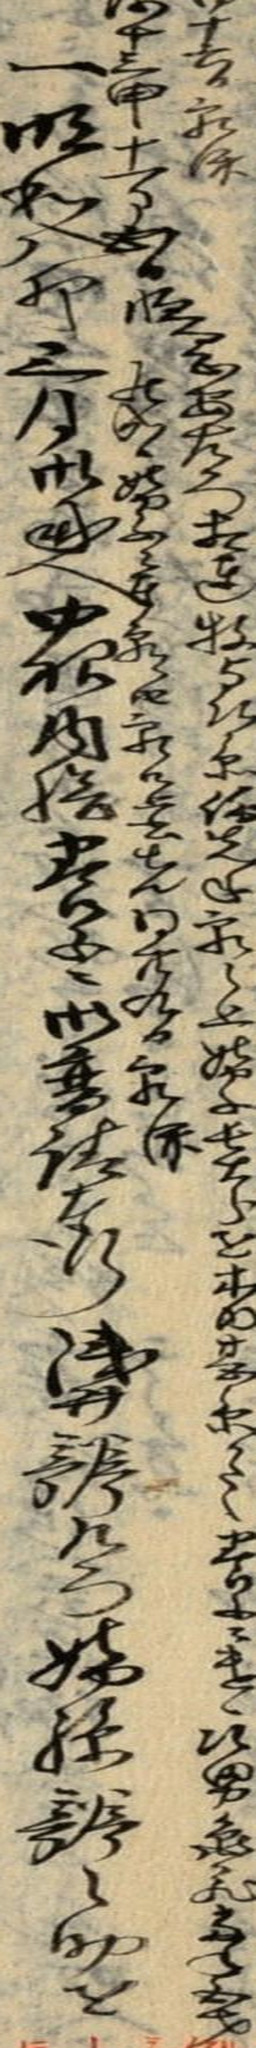一明和八卯三月御用人中根内膳養子に御普請奉行浅井弁左衛門嫡孫弁之助を
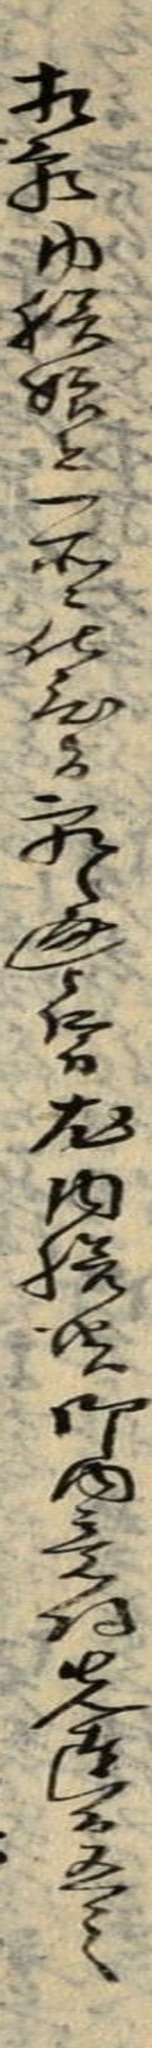相願内膳娘と一所に仕度旨願之通被仰付尤内膳儀ハ御内意伺先達而有之
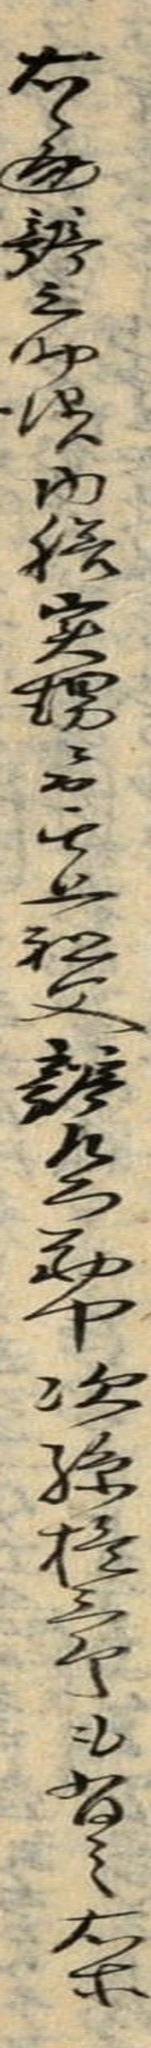右之通弁之助儀は内膳実甥に而其上祖父弁左衛門勤中次孫権三郎も有之右等
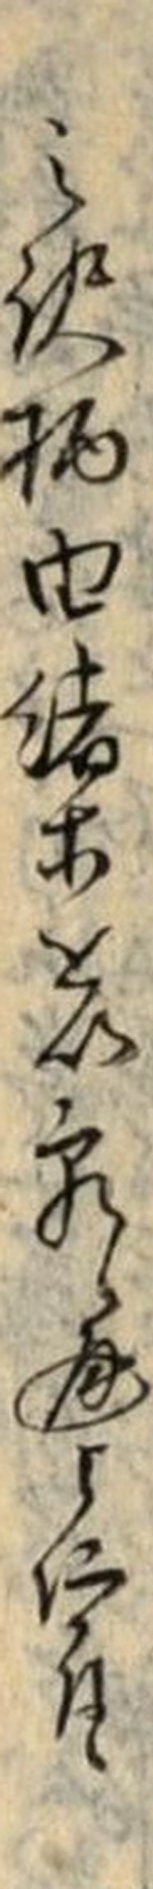之訳柄由緒等を以願之通被仰付候
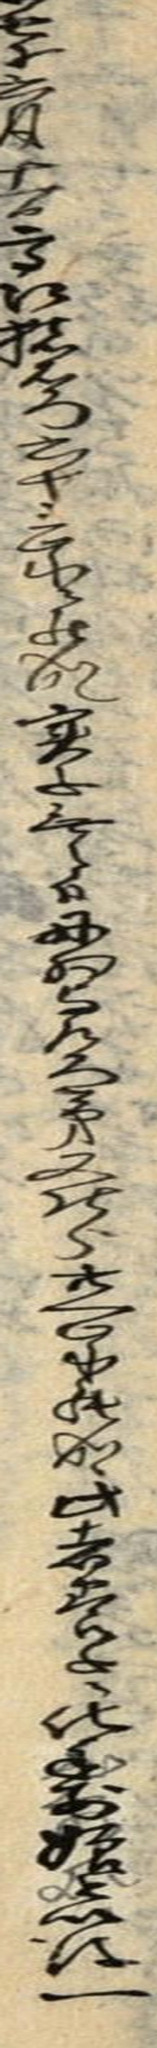一享保七刁六月十一日高江猪右衛門六十三歳に罷成候実子無之に付丹羽与左衛門弟又次郎廿一歳罷成候此者養子に仕手前娘と以後一
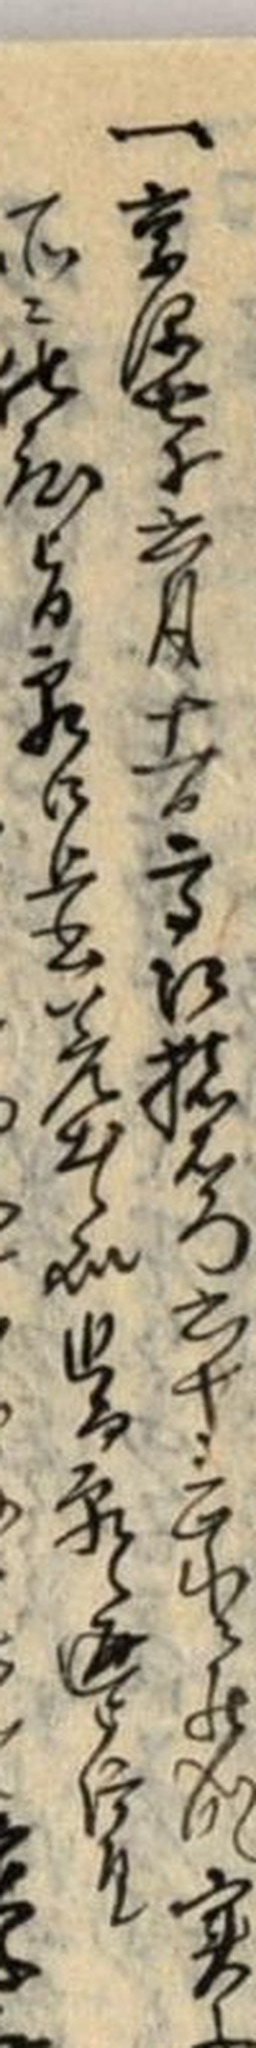所に仕度旨願口上書差出候処追而願之通被仰付候
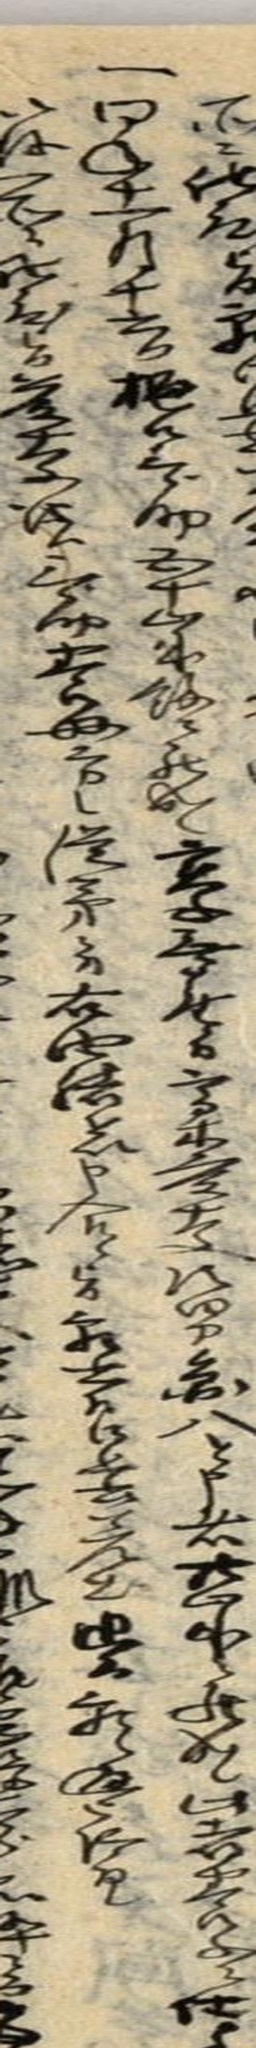以後一所に仕度旨藤大夫儀は三郎助養母方之従弟に付右由緒を以申合候旨願書付口上書差出追而願之通被仰付候
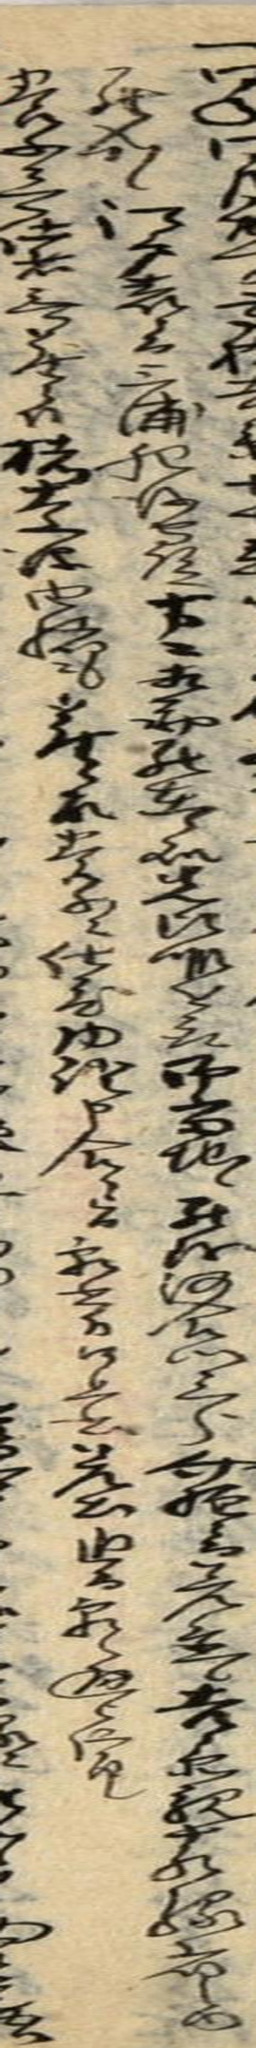養子に可仕者無御座候に付い猪大夫儀由緒も御座候故養子に仕度内証申合候旨願書付口上書差出追而願之通被仰付候

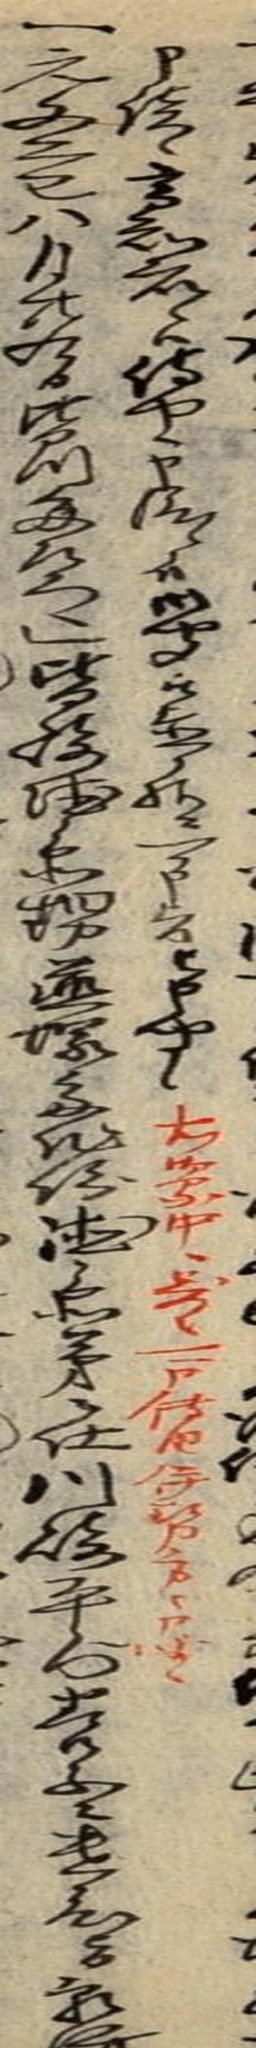一元文二巳八月廿九日皆川多左衛門へ」皆崎徳兵衛甥韮塚多作儀徳兵衛弟に仕川崎平右衛門養子に遣度旨願済
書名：養子縁組之部
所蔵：福井県文書館 Fukui Prefectural Archives
